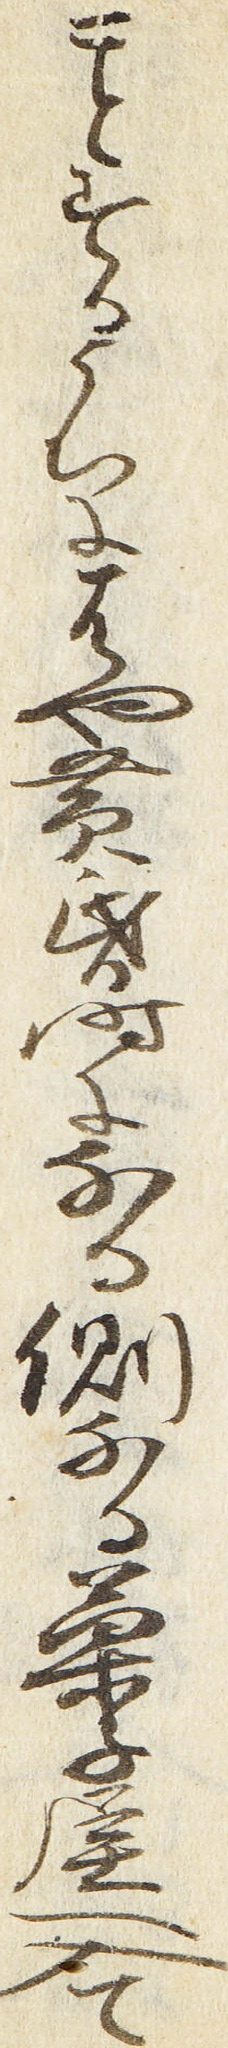ことするうちにはや黄昏時になる側なる菓子屋へ入て
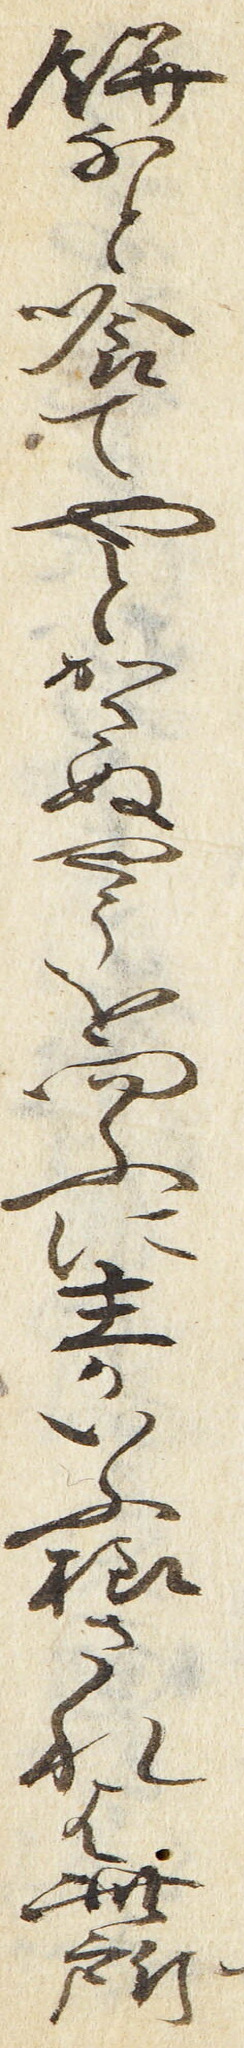餅なと食てやとかさぬやうを問ふに主かいふ様されは此所

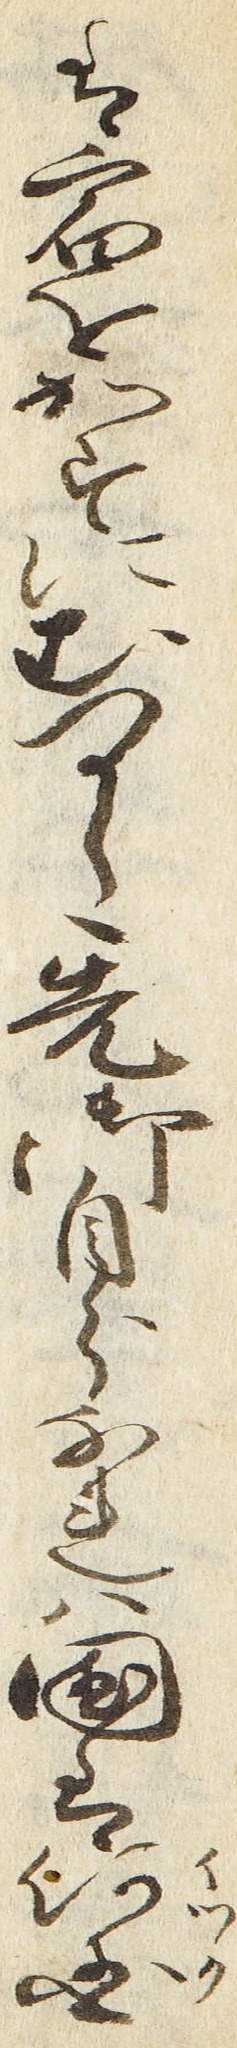は宿をかすにむつかしく先御自分なれは国は何国
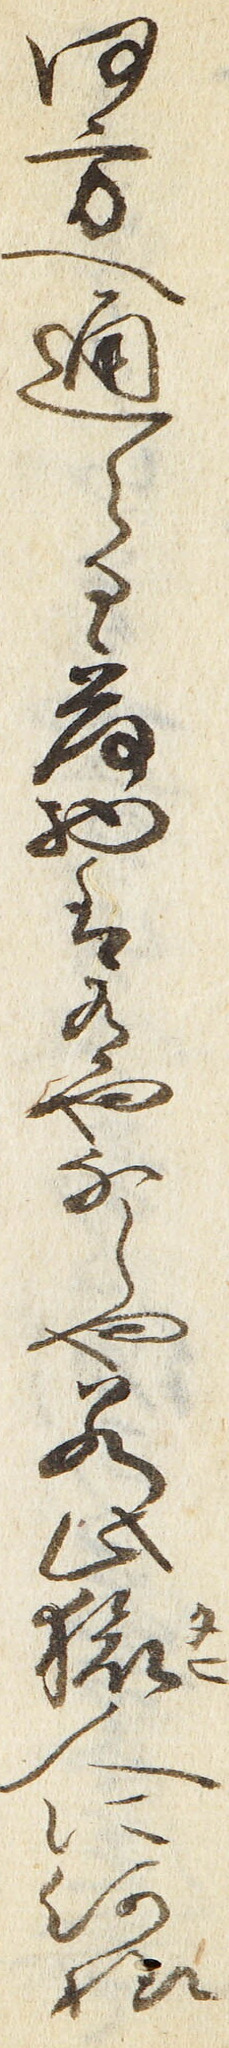何方へ通らる荷物は有やなしや若此旅人に何様
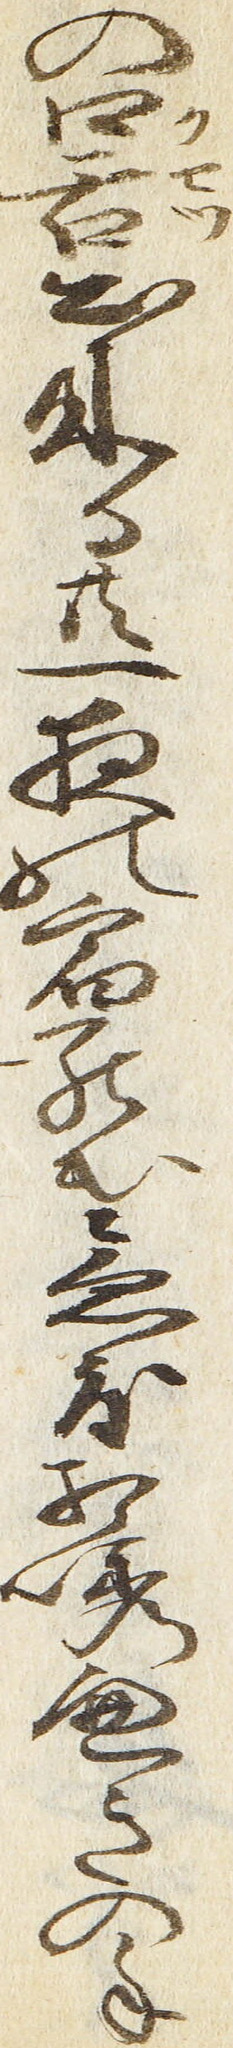の口舌出来る共一夜の宿罷出急度相唀へきの手
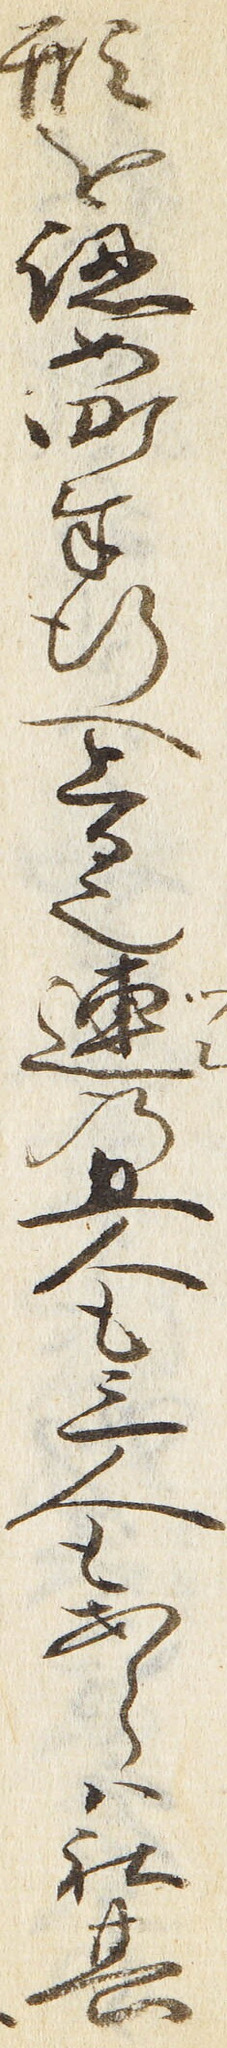形を認め町奉行へ上る也連の五人も三人もあらは社其
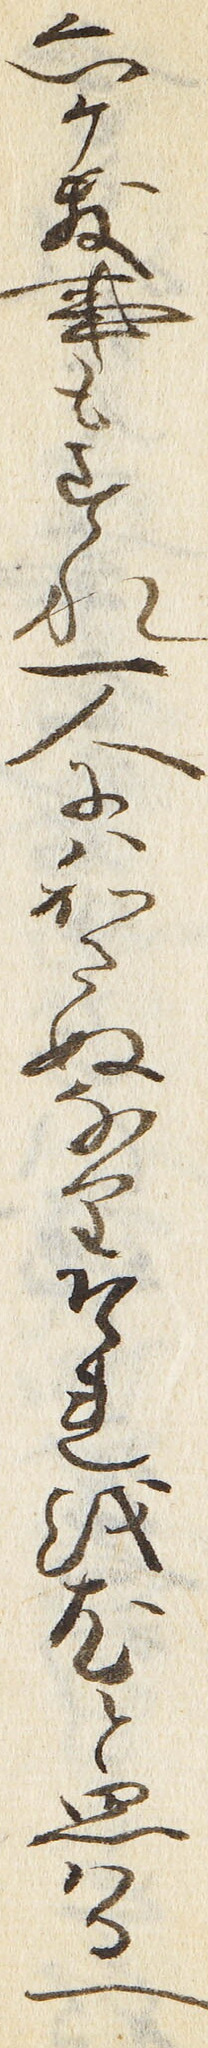六ケ敷事もすれ一人にはかさぬなりそれを尤と思はるへ
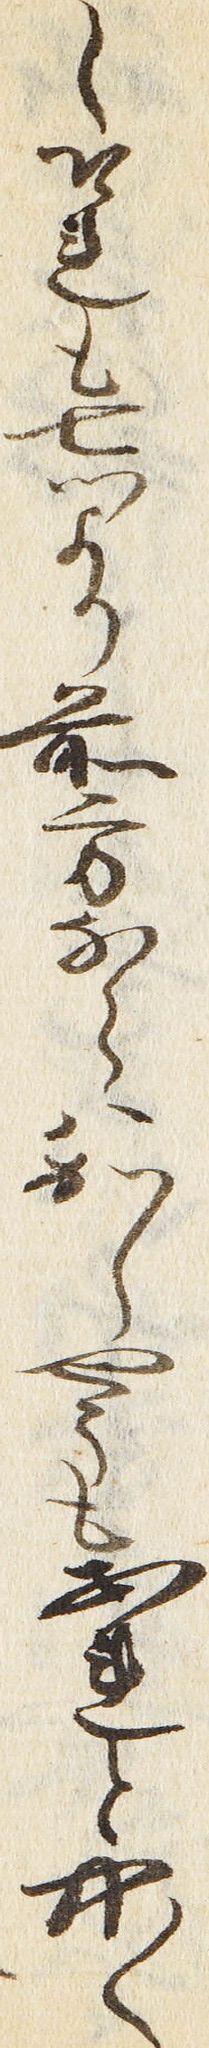しそれも七ツより前方ならはかしやうもあれと中〳〵
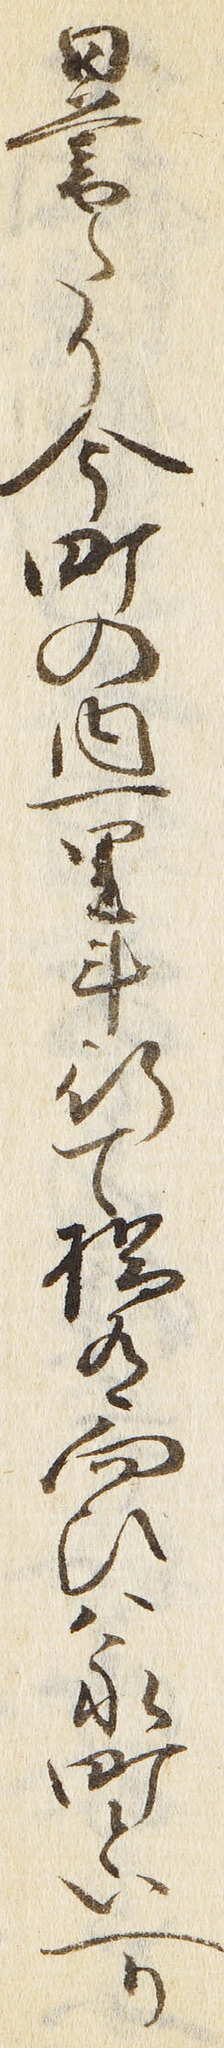日暮たり今町の内一里計行て橋有向ひは永町といへり
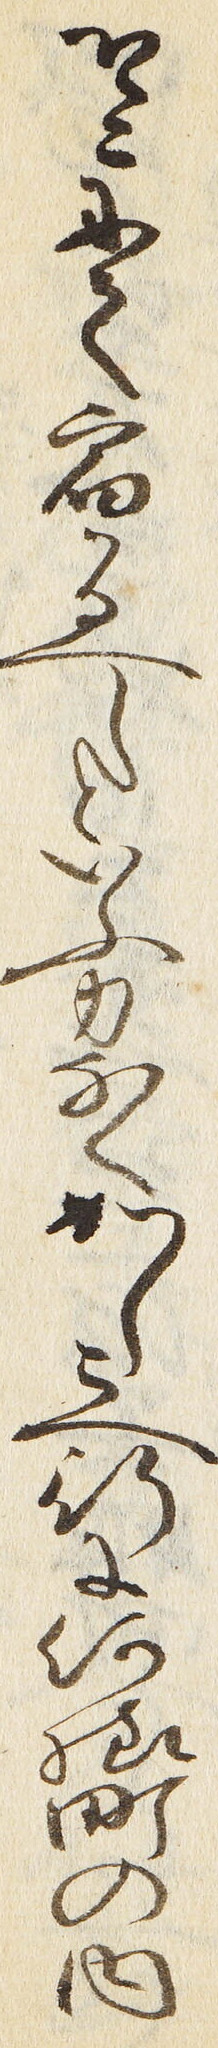そこにて宿かるへしといふ力なくかしこへ行に何様町の内
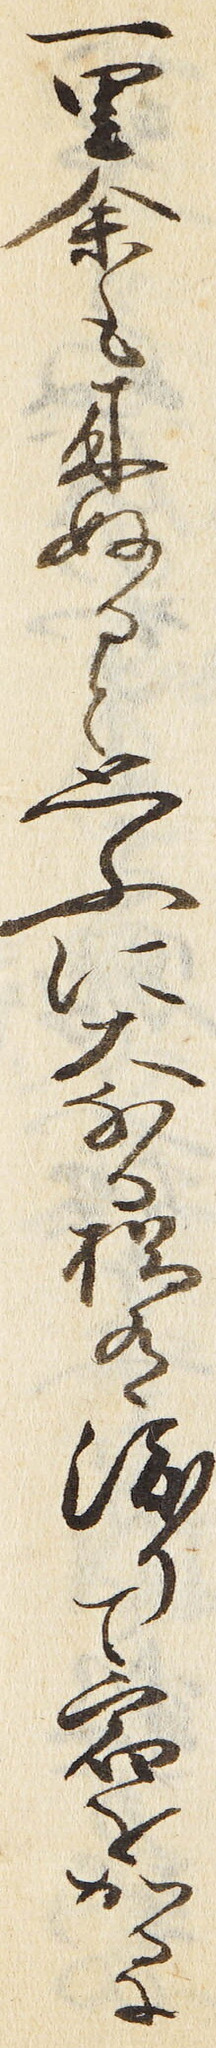一里余も来ぬると思ふに大なる橋有渡りて宿をかるに
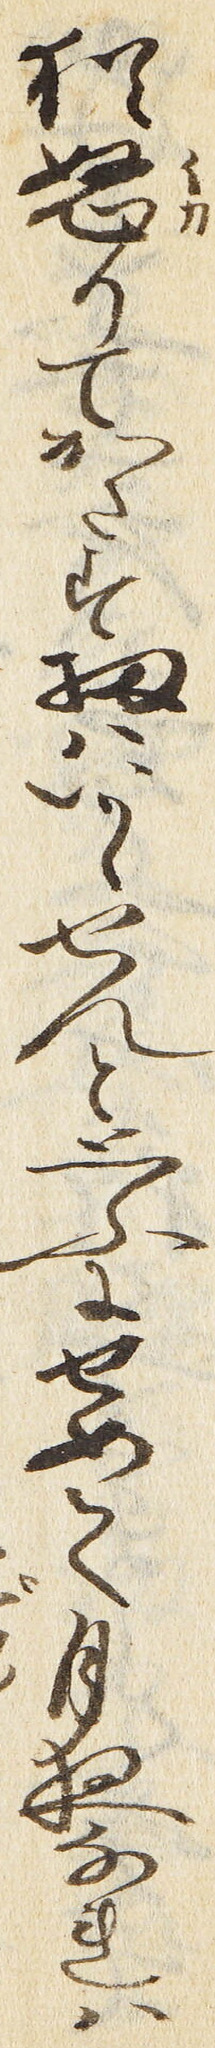猶怒りてかさす扨はいかゝせんと思ふにせめて月夜なれは
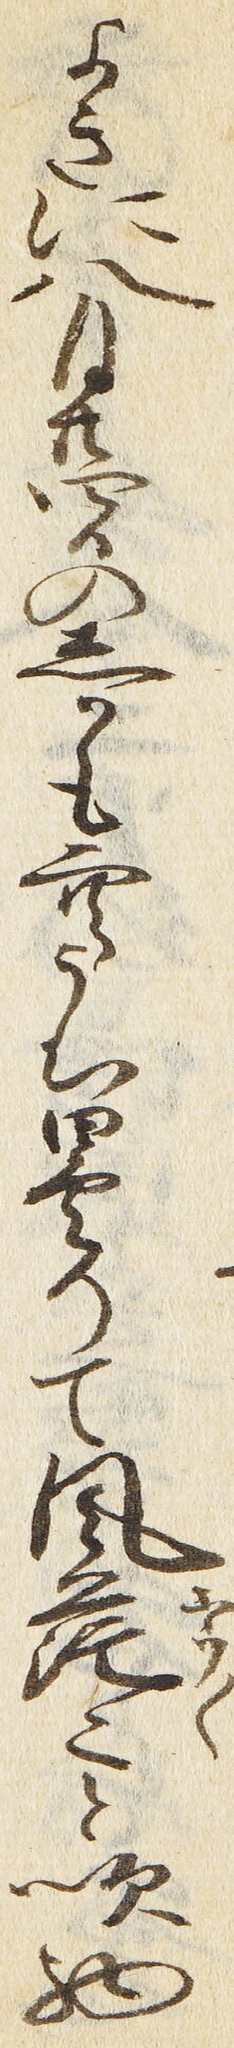よきに八月廿四日のしかも空うち曇りて風茫々と吹物
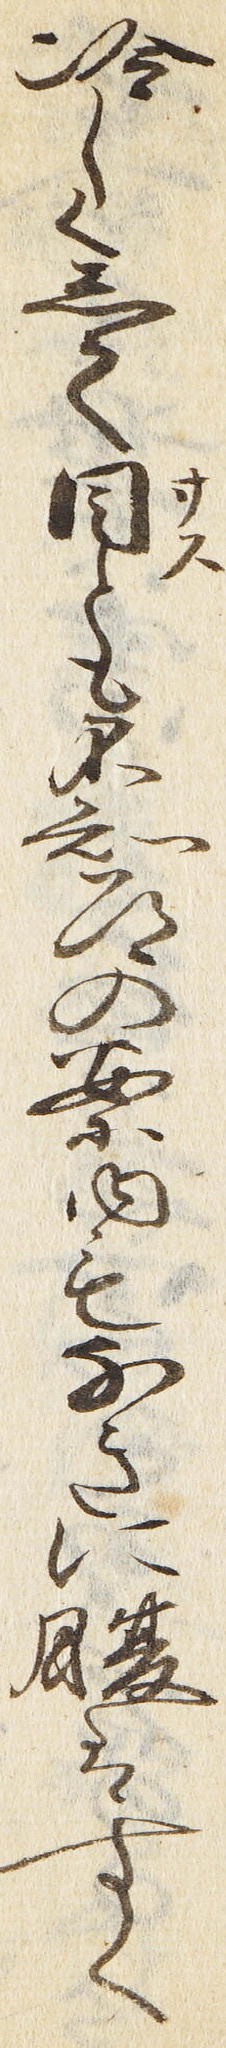冷しくして目とも不知道の案内もなきに腹はすく
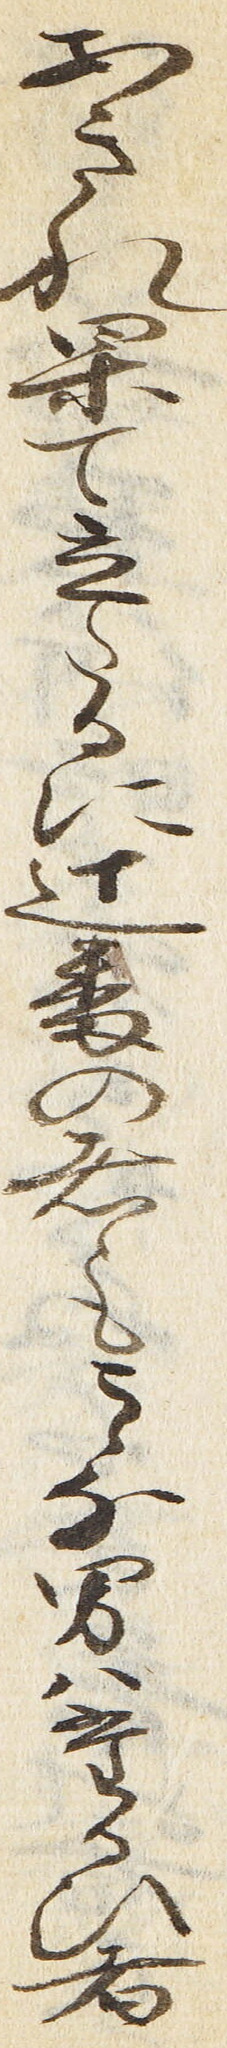あきれ果て立たるに辻番の者ともこゝな男はたるひ者
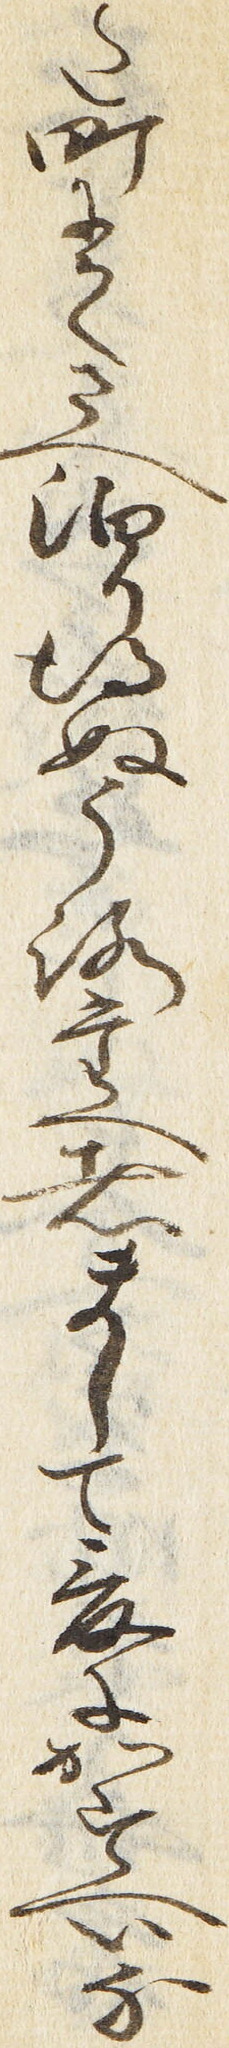た町にてさへ泊り得ぬうろたへ者まして爰にかすへいな
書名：海陸世話日記
